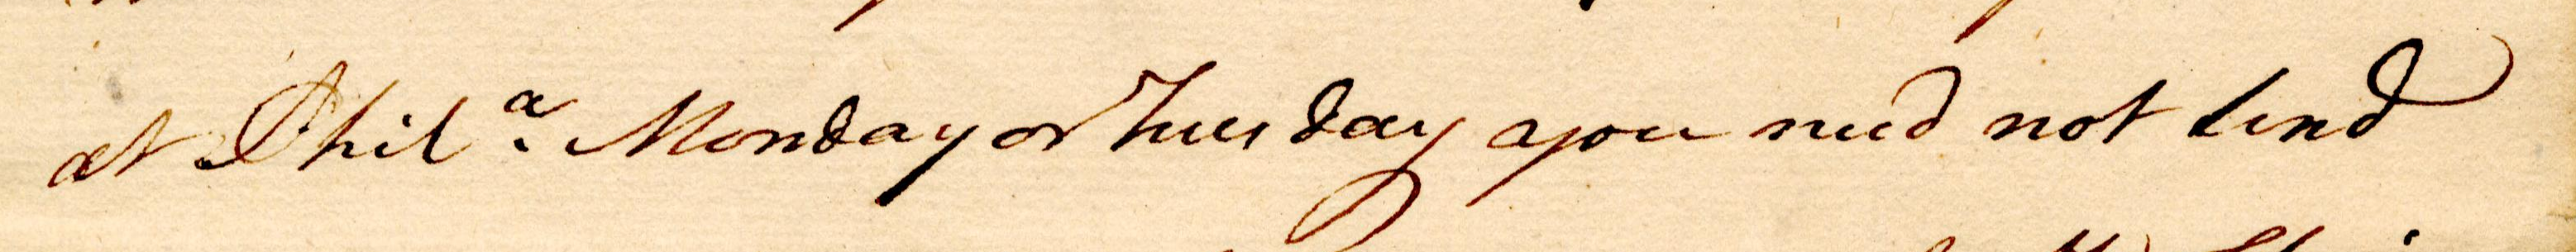at Phil^a. Monday or Tuesday you need not send
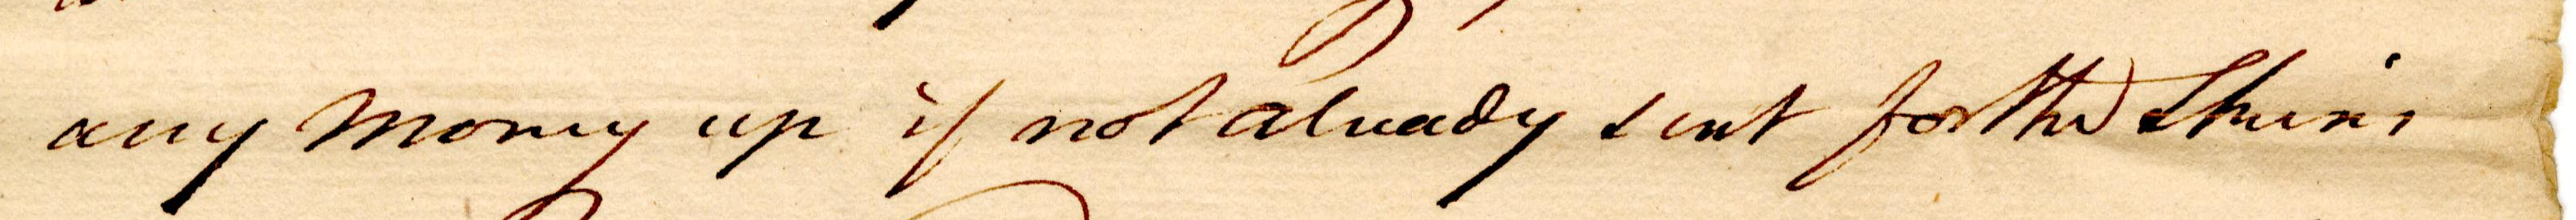any money up if not already sent for the skins
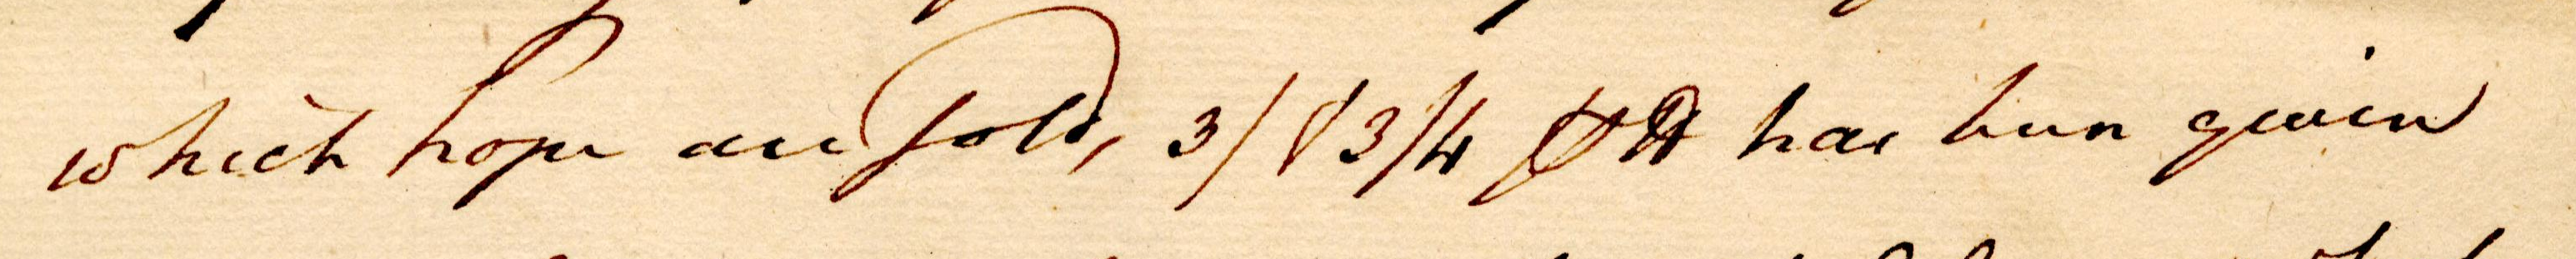which hope are sold, 3s & 3s4 per ld has been given
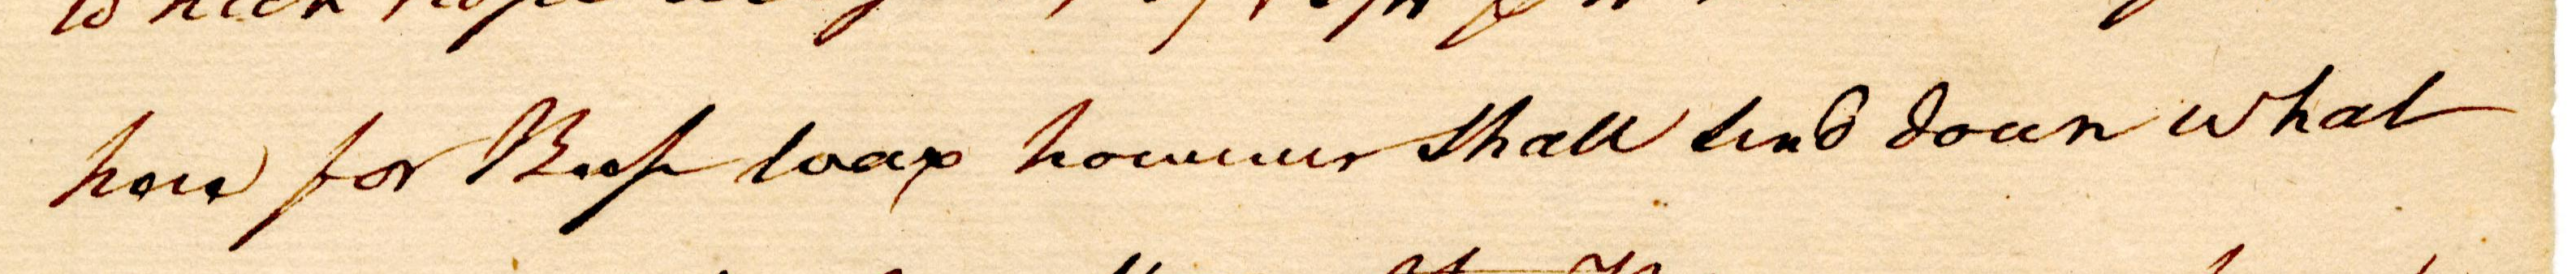here for Beeswax however shall send down what
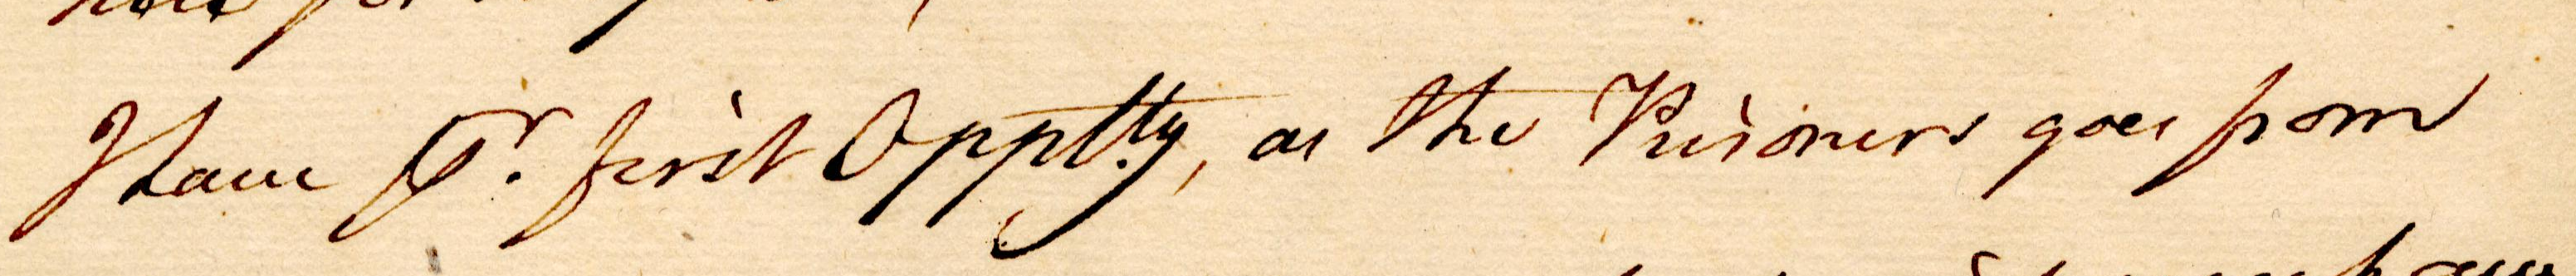I have p^r. first Opp^ty., as the Prisoners goes from
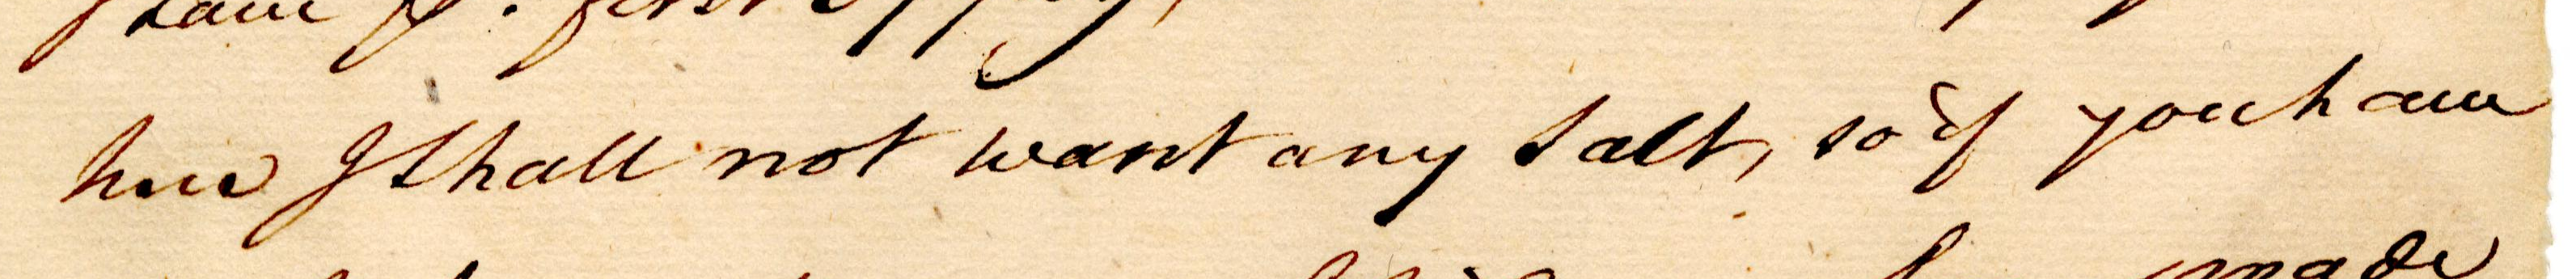here I shall not want any salt, so if you have
